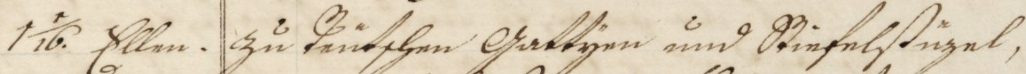1 1/16. Ellen. zu Teütschen Gattyen und Stiefelstüzel,
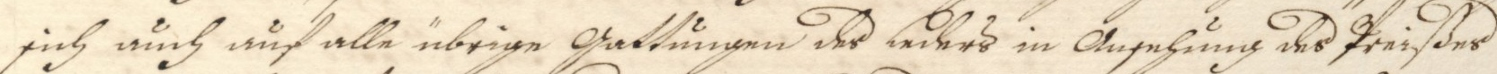sich auch auf alle übrige Gattungen des Leders in Ansehung des Preißes
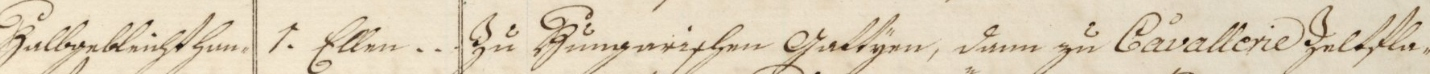Halbgebleicht han 1. Ellen... Zu Hungarischen Gattyen, dann zu Cavallerie Zeltfla-
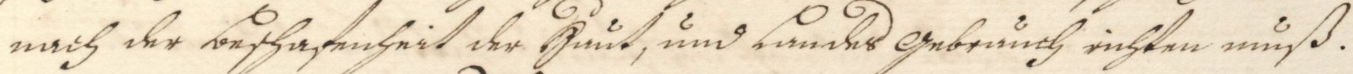nach der Beschafenheit der Haut, und Landes Gebrauch richten muß.
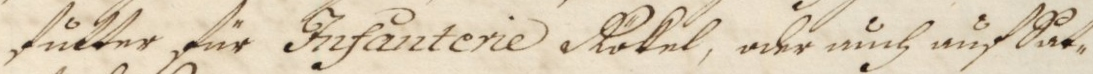futter für Infanterie Rökel, oder auch auf Sat-
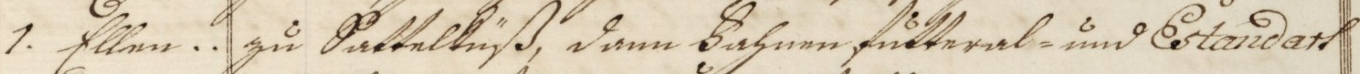1. Ellen... zu Sattelküß, dann Fahnen futteral- und Estandart
